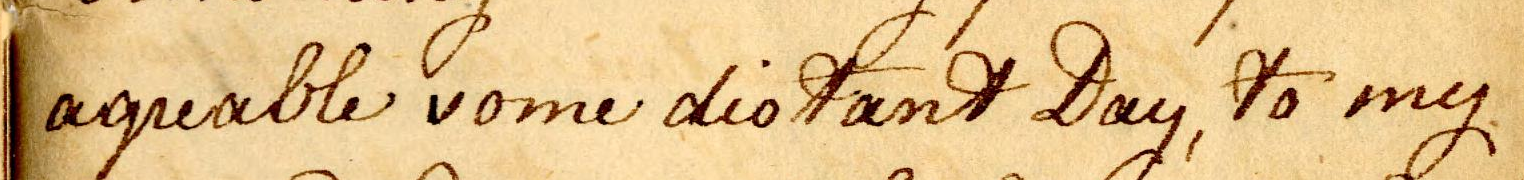ageable some distant Day to my
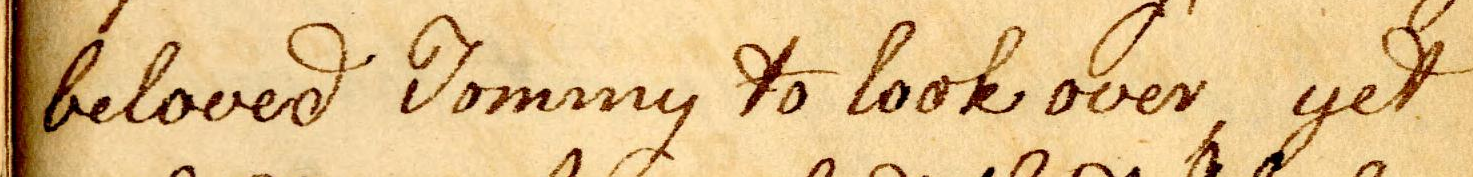beloved Tommy to look over, yet
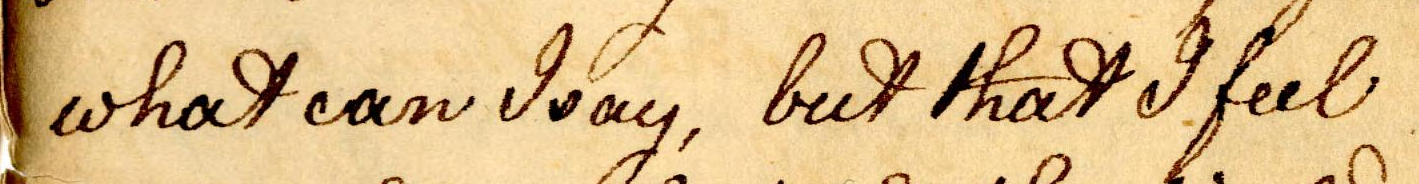what can I say, but that I feel
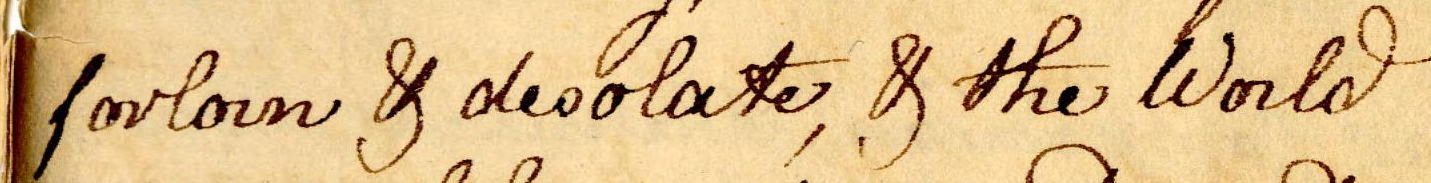forlorn & desolate, & the World
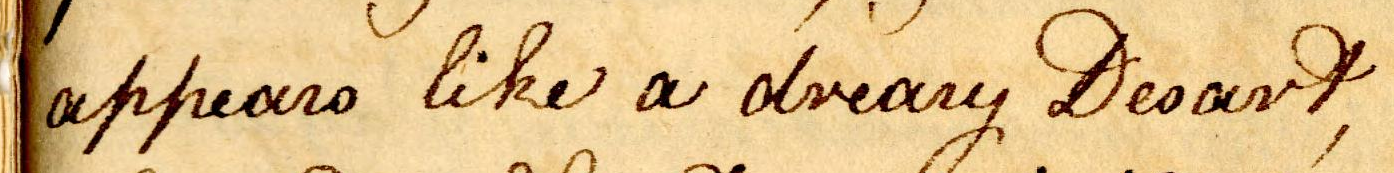appears like a dreary Desart,
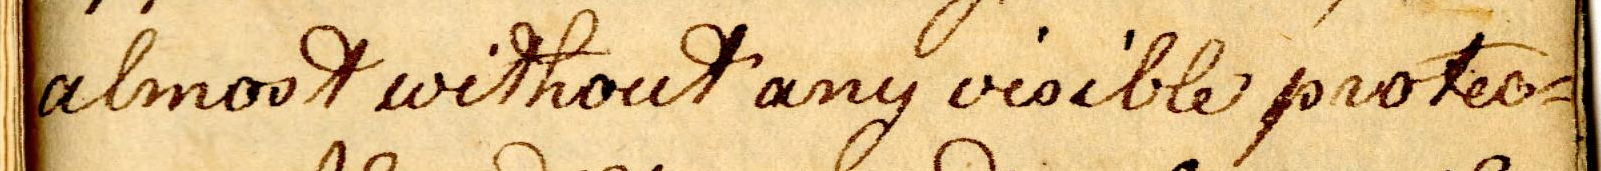almost without any visible protec-
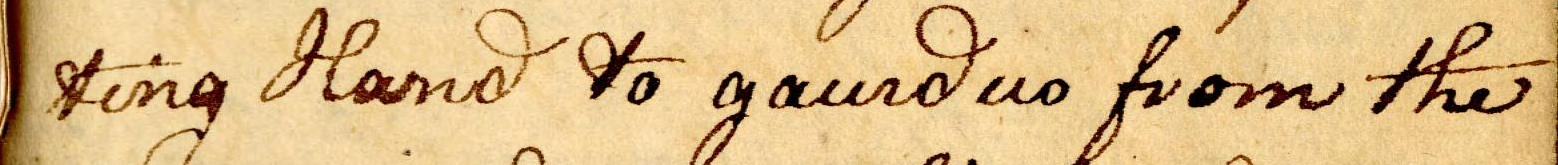ting Hand to gaurd us from the
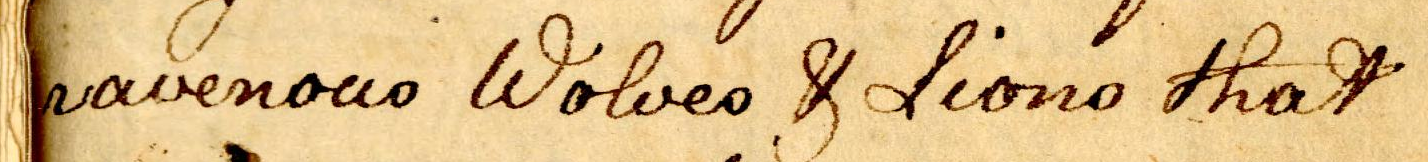ravenous Wolves & Lions that
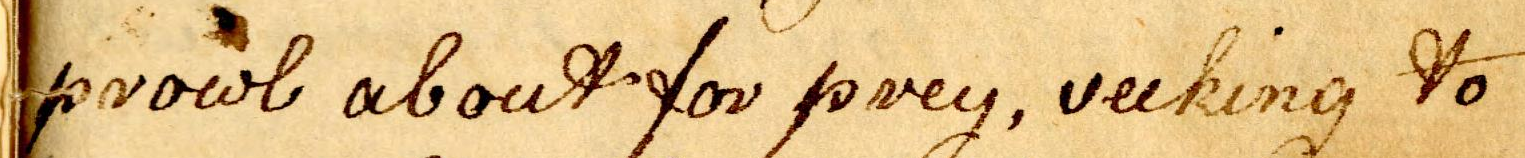prowl about for prey, seeking to
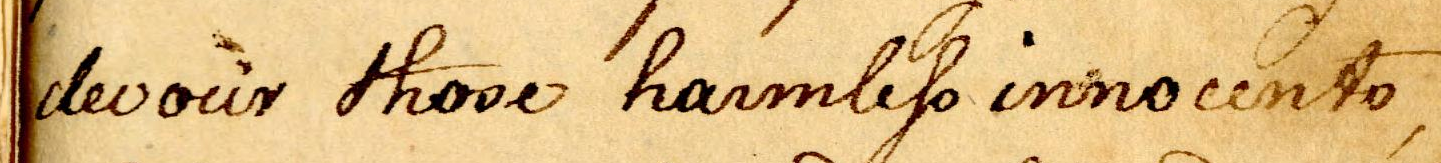devour those harmless innocents
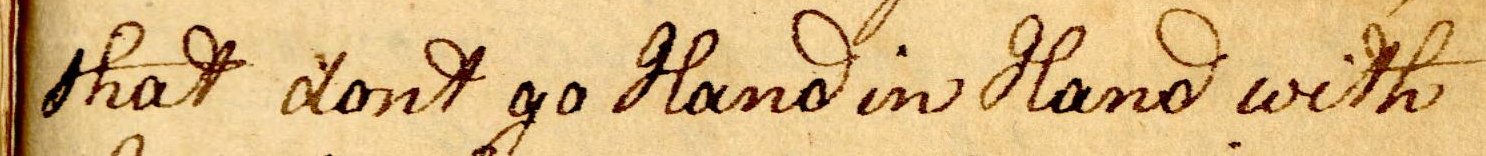that dont go Hand in Hand with
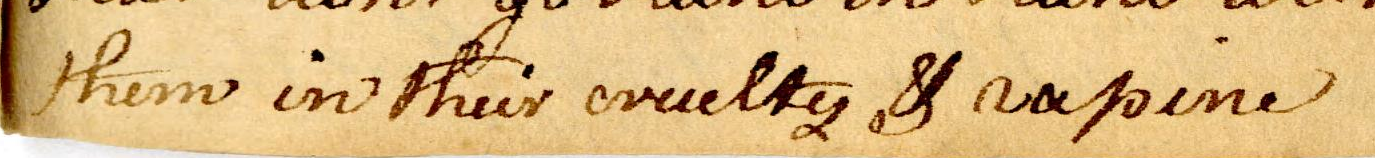them in their cruelty & rapine
